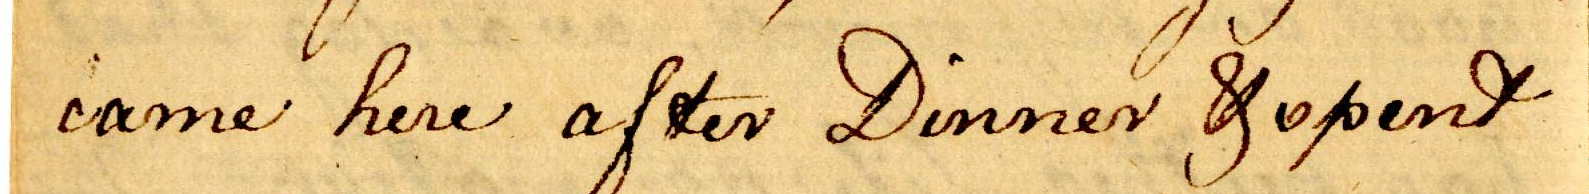came here after Dinner & spent
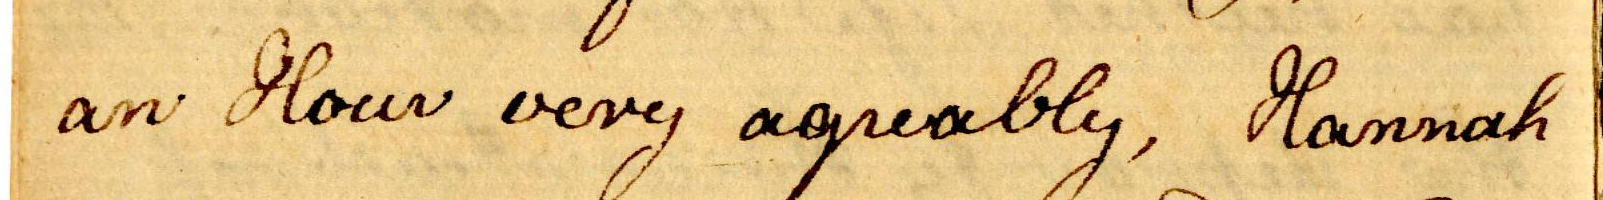an Hour very agreably, Hannah
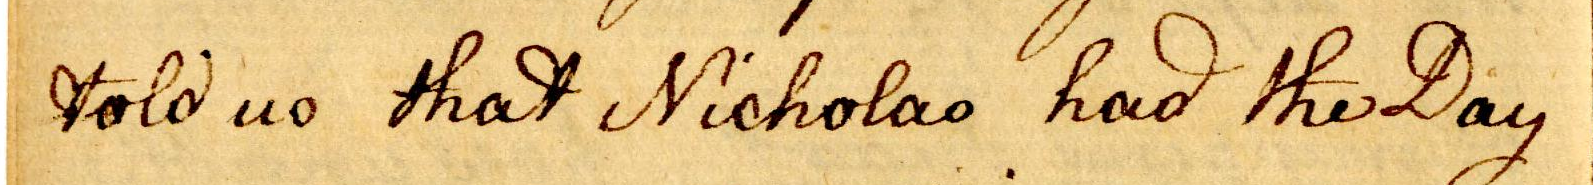told us that Nicholas had the Day
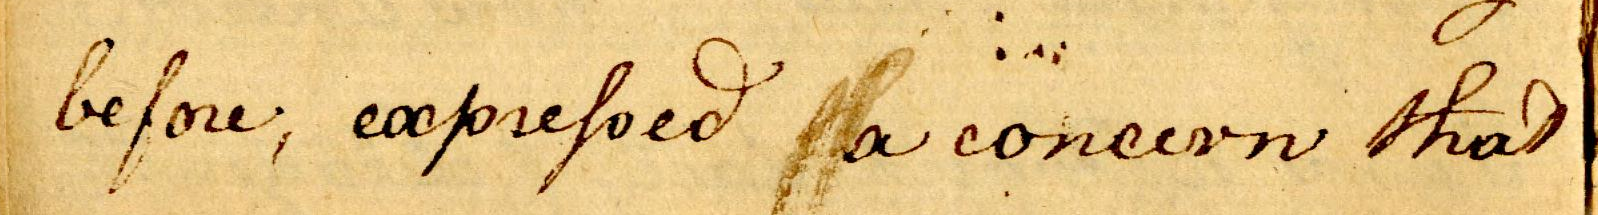before, expressed a concern that
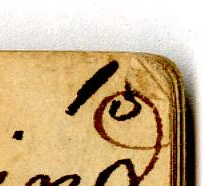13
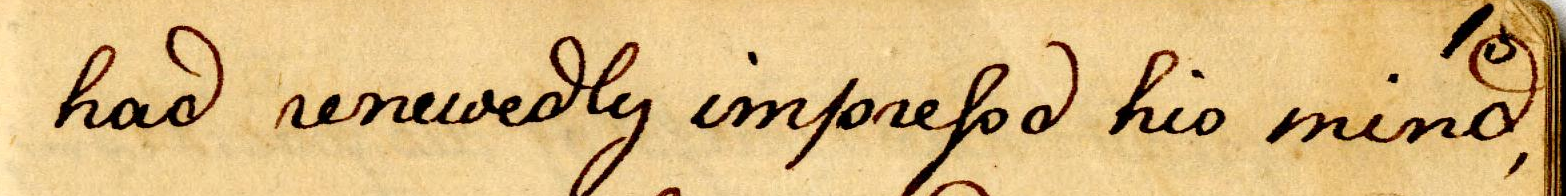had renewedly impressed his mind,
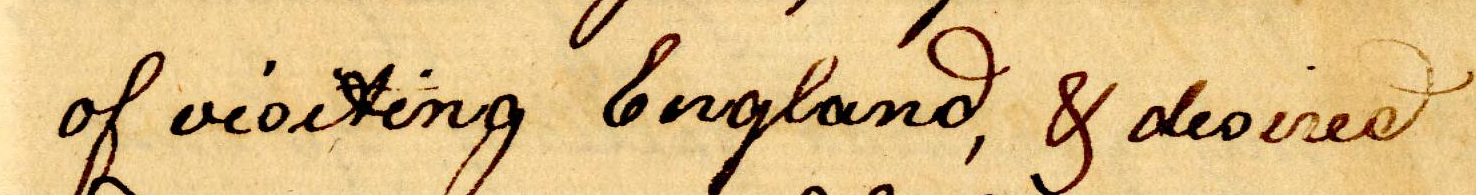of visiting England, & desired
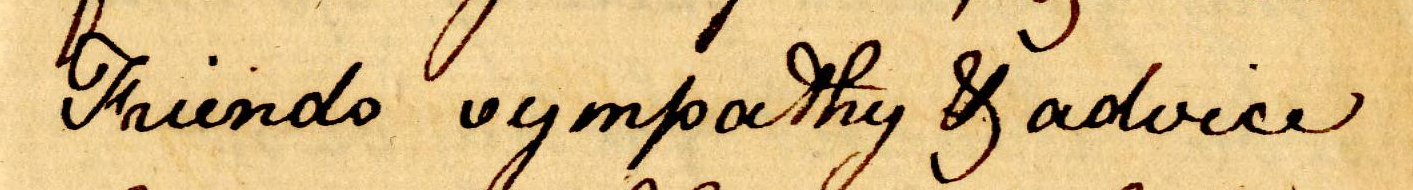Friends sympathy & advice
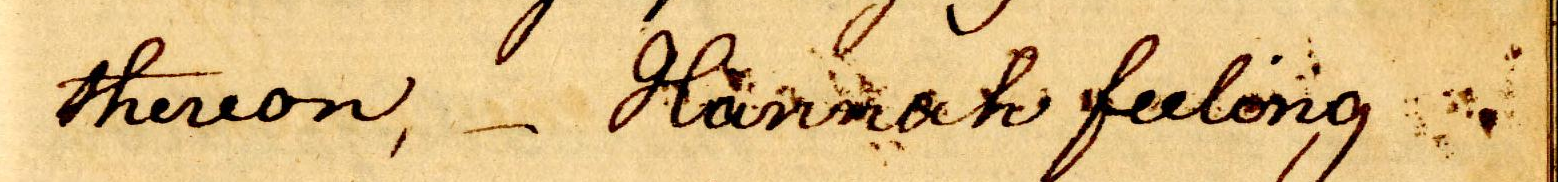thereon,- Hannah feeling
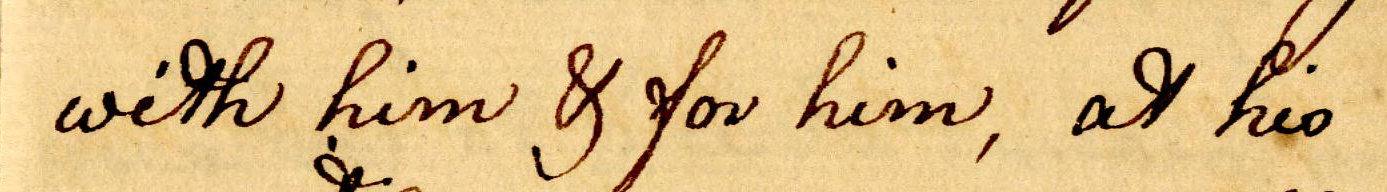with him & for him, at his
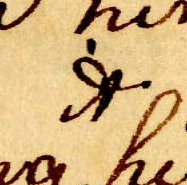it
